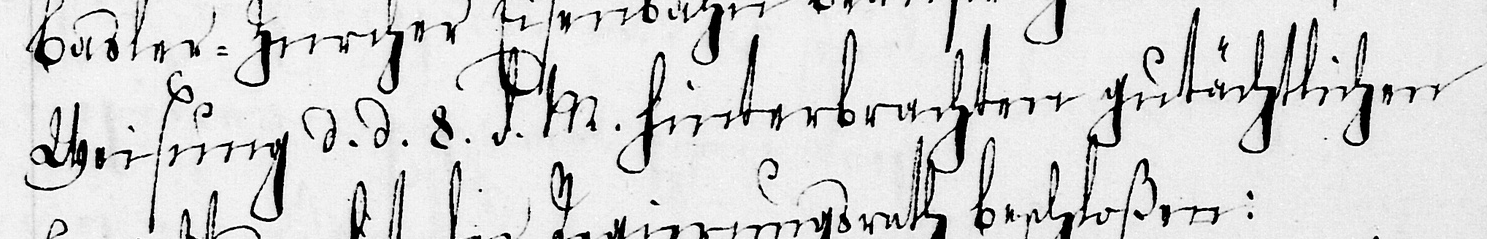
Weisung d. d. 8. d. M. hinterbrachten gutächtlichen
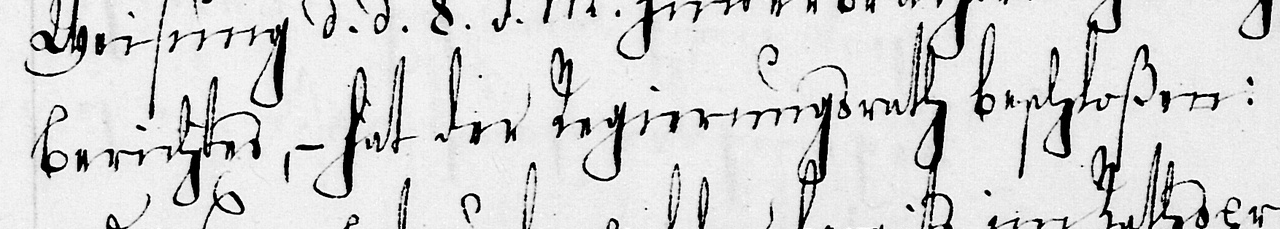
Berichtes, – hat der Regierungsrath beschloßen:
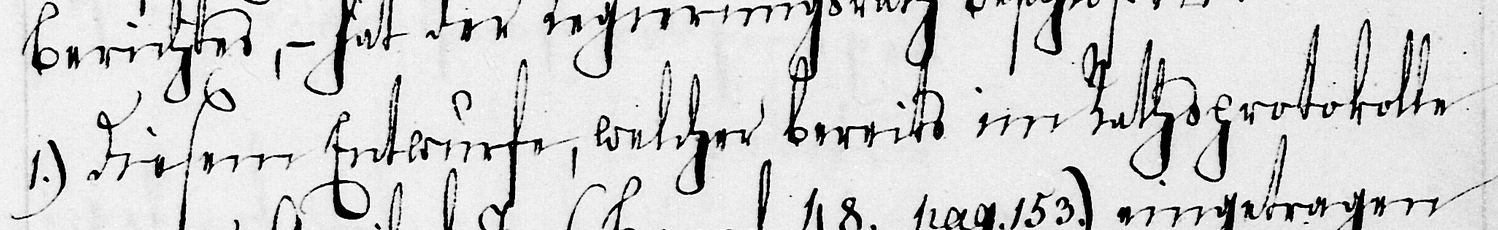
1.) Diesem Entwurfe, welcher bereits im Rathsprotokolle
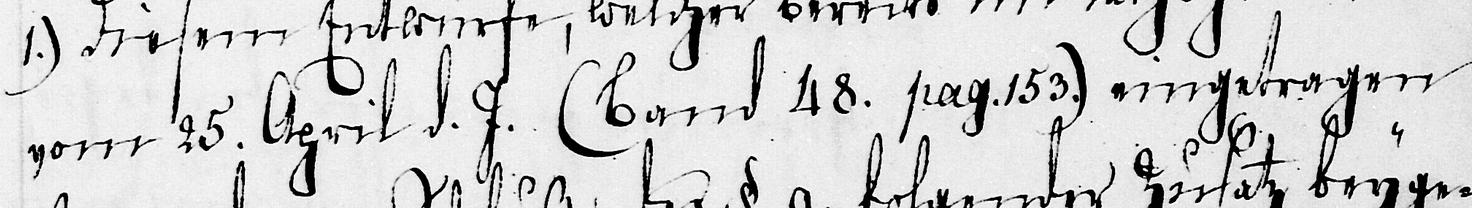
vom 25. April d. J. (Band 48. pag. 153.) eingetragen
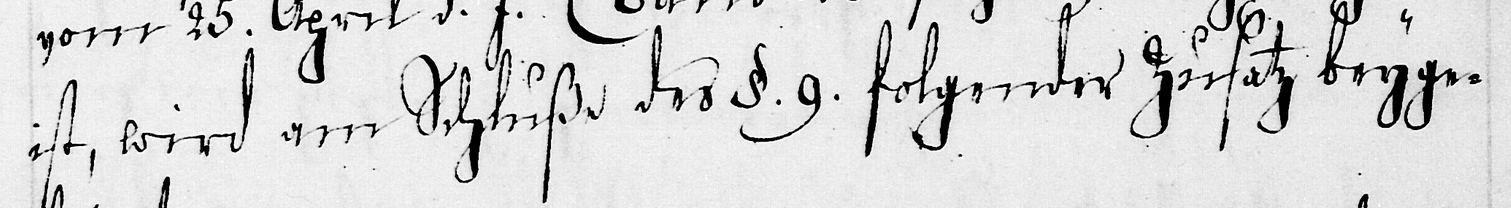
ist, wird am Schluße des §. 9. folgender Zusatz beyge¬
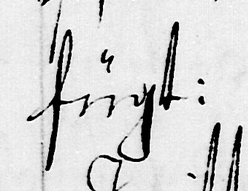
fügt:
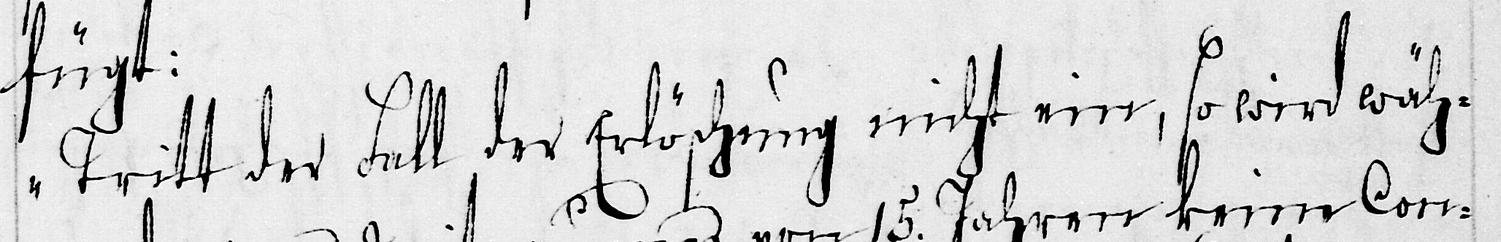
„Tritt der Fall der Erlöschung nicht ein, so wird wäh¬
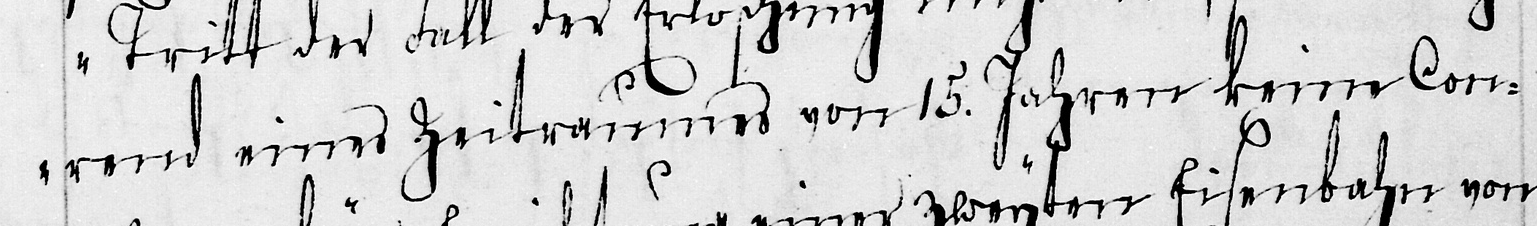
rend eines Zeitraumes von 15. Jahren keine Con¬
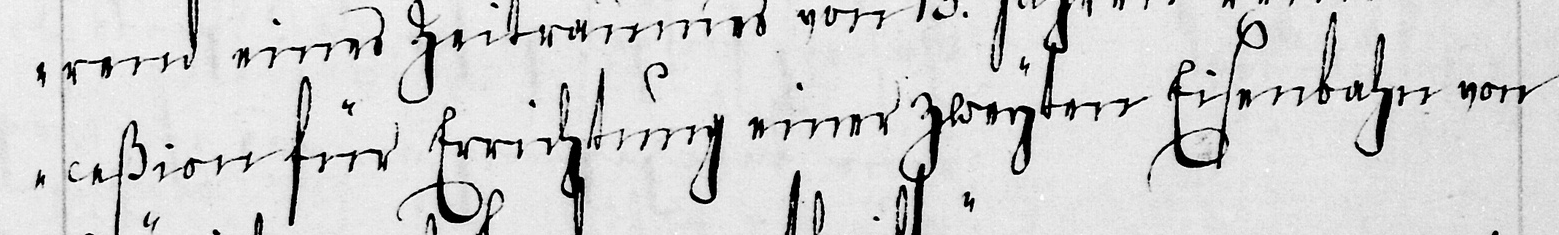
ceßion für Errichtung einer zweyten Eisenbahn von
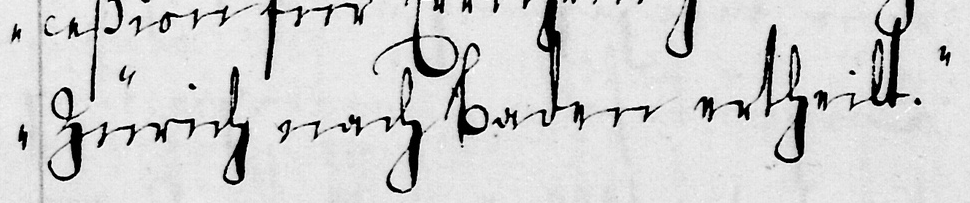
Zürich nach Baden ertheilt.“
